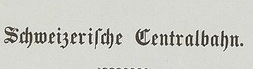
Schweizerische Centralbahn.
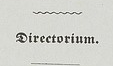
Directorium.
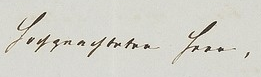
Hochgeachteter Herr,
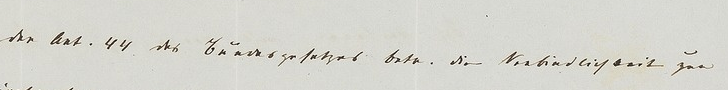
Der Art. 44 des Bundesgesetztes betr. die Verbindlichkeit zur
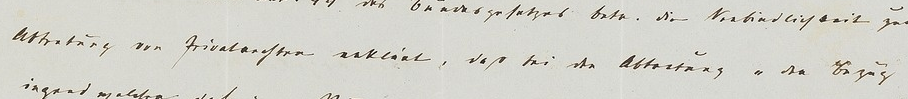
Abtretung von Privatrechten erklärt, daß bei der Abtretung «der Bezug
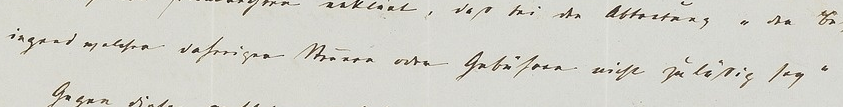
irgend welcher daheriger Steuern oder Gebühren nicht zulässig sey».
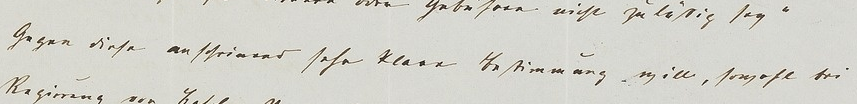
Gegen diese anscheinend sehr klare Bestimmung will, sowohl bei
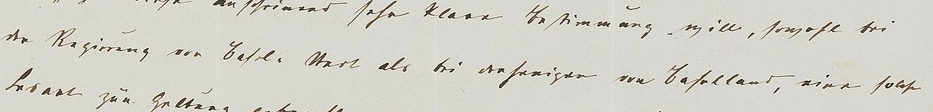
der Regierung von Basel-Stadt als bei derjenigen von Baselland, eine solche
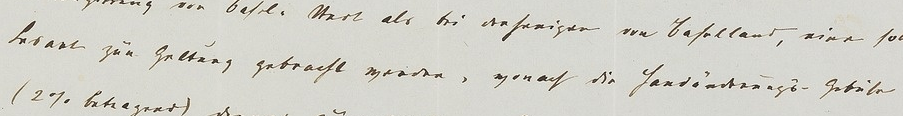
Lesart zur Geltung gebracht werden, wonach die Handänderungs-Gebühr
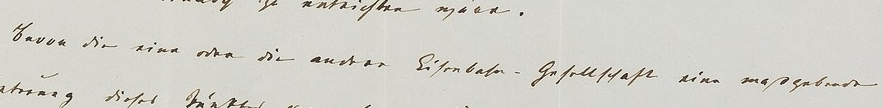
Bevor die eine oder die andere Eisenbahn-Gesellschaft eine maßgebende
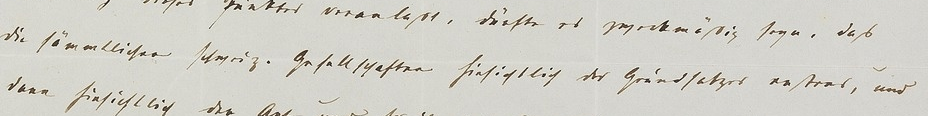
die sämmtlichen schweiz. Gesellschaften hinsichtlich des Grundsatzes erstens, und
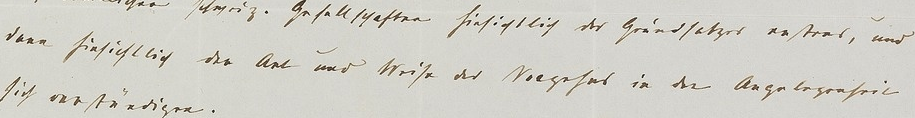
dann hinsichtlich der Art und Weise des Vorgehens in der Angelegenheit
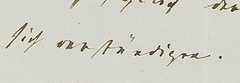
sich verständigen.
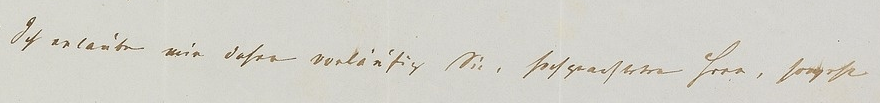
Ich erlaube mir daher vorläufig Sie, hochgeachteter Herr, sowohl
